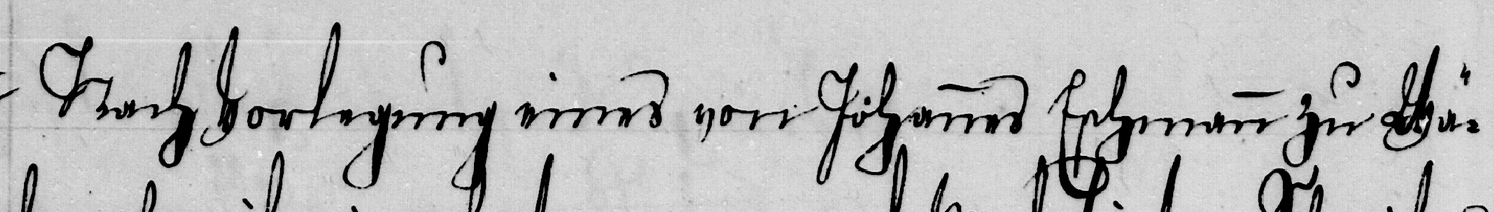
Nach Vorlegung eines von Johannes Eschmann zu Wä¬
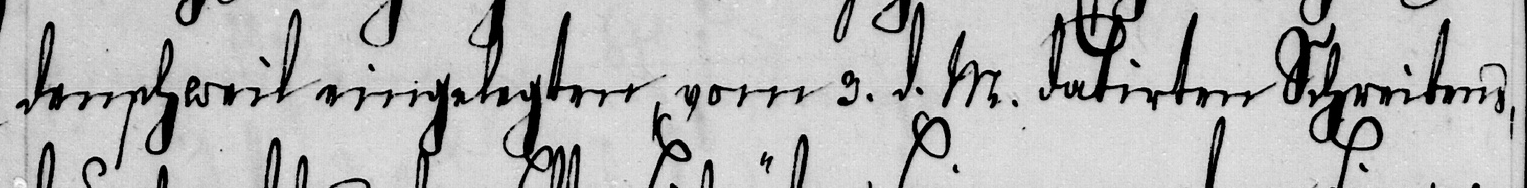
denschweil eingelegten, vom 3. d. M. datirten Schreibens,
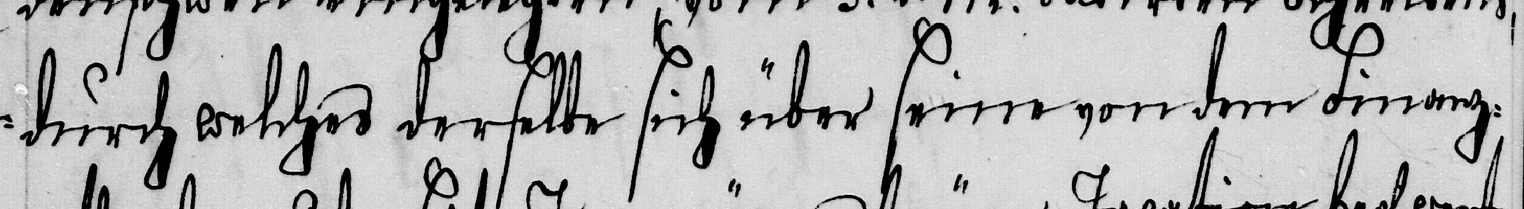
durch welches derselbe sich über seine von dem Finanz¬
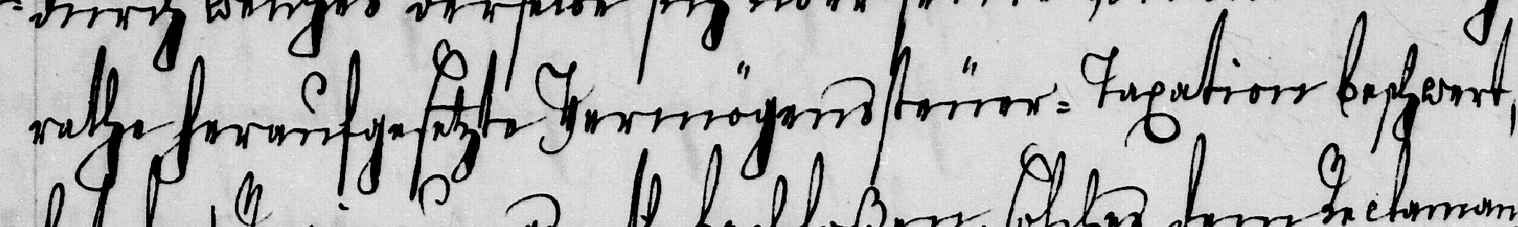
rathe heraufgesetzte Vermögenssteuer-Taxation beschwer¬
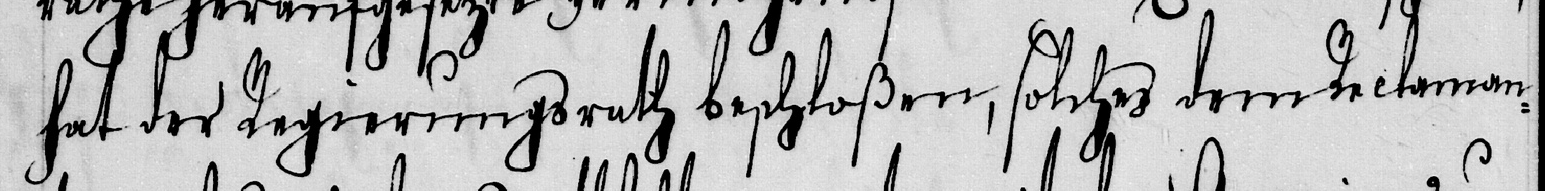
hat der Regierungsrath beschloßen, solches dem Reclaman¬
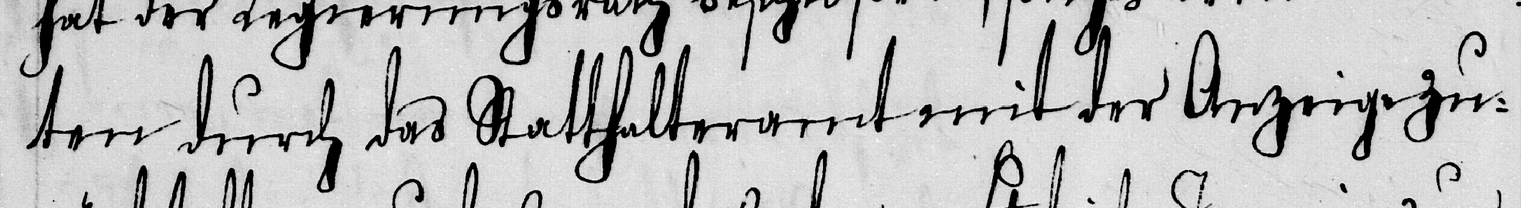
ten durch das Statthalteramt mit der Anzeige zu¬
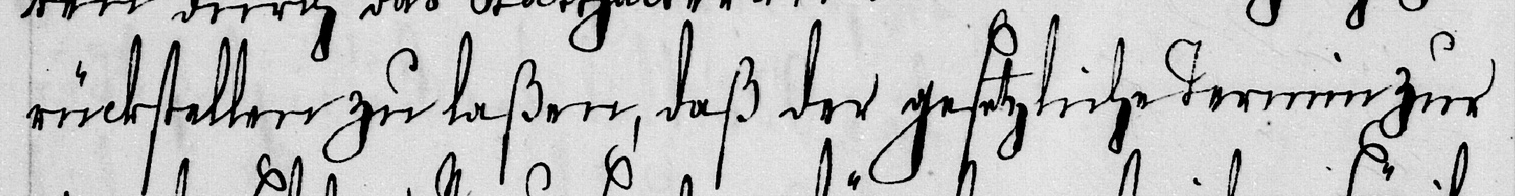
rückstellen zu laßen, daß der gesetzliche Termin zur
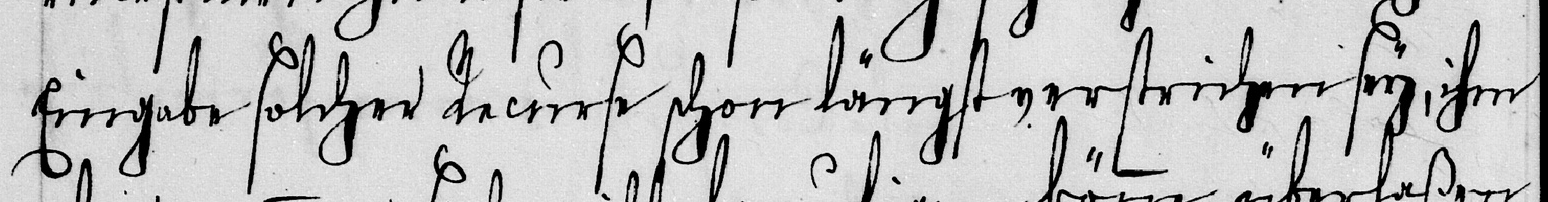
Eingabe solcher Recurse schon längst verstrichen sey, ihm
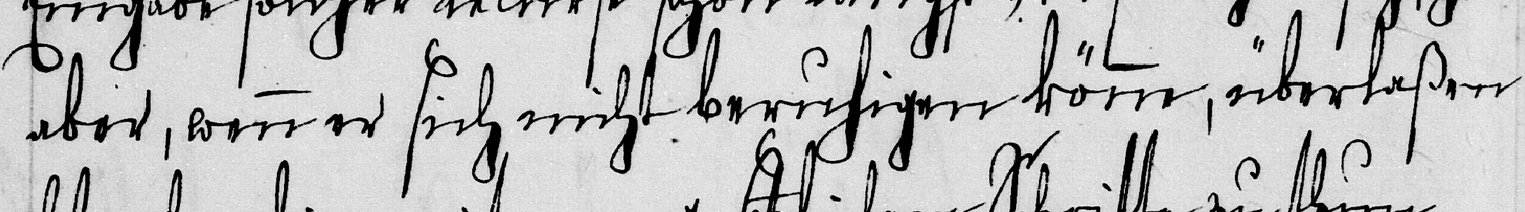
aber, wenn er sich nicht beruhigen könne, überlaßen
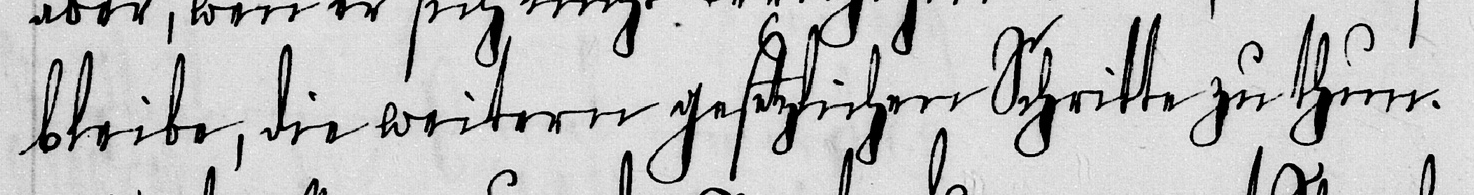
bleibe, die weitern gesetzlichen Schritte zu thun.
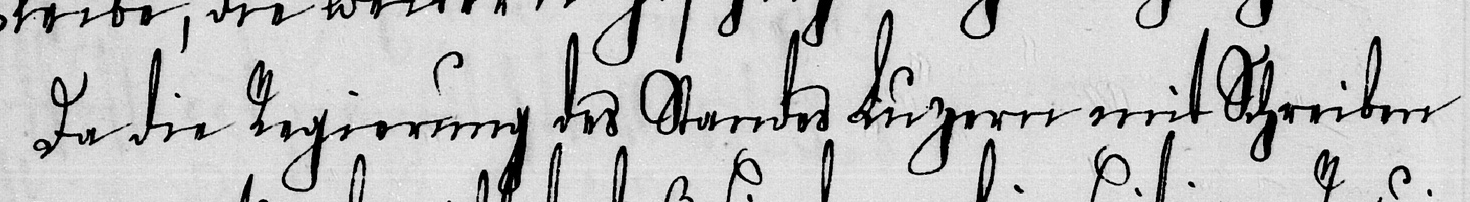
Da die Regierung des Standes Luzern mit Schreiben
